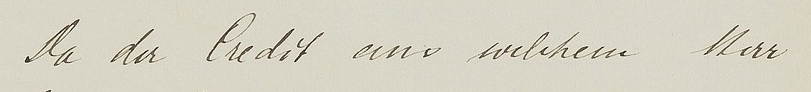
Da der Credit aus welchem Herr
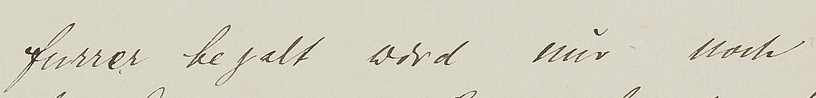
Furrer bezalt wird nur noch
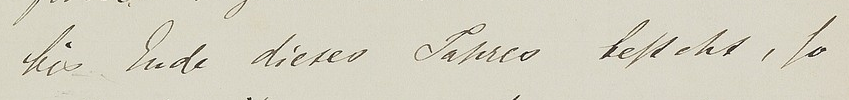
bis Ende dieses Jahres besteht, so
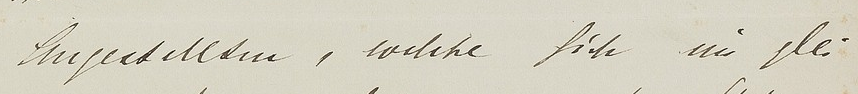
Angestellten, welche sich im glei-
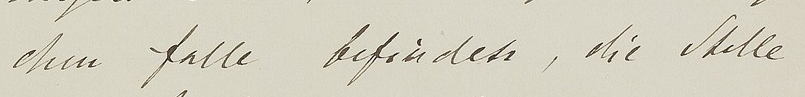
chen Falle befinden, die Stelle
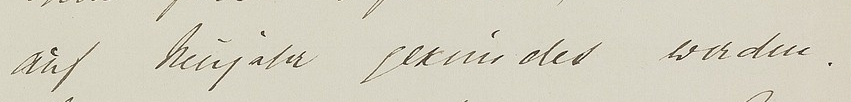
auf Neujahr gekündet werden.
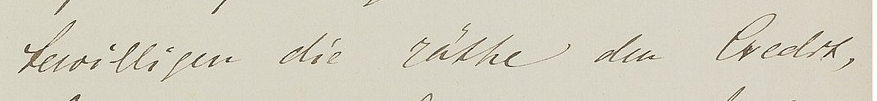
Bewilligen die Räthe den Credit,
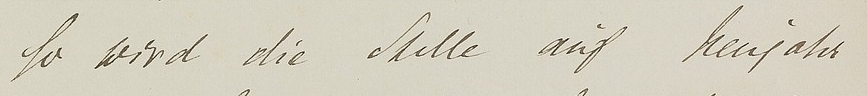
so wird die Stelle auf Neujahr
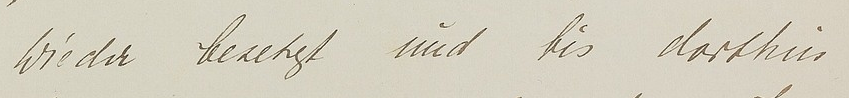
wieder besetzt und bis dorthin
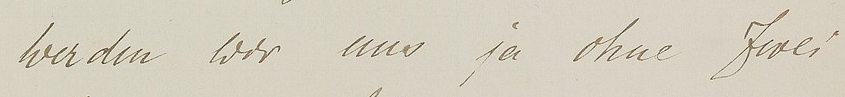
werden wir uns ja ohne Zwei-
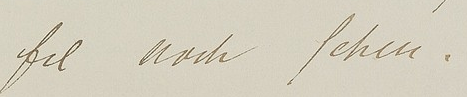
fel noch sehen.
